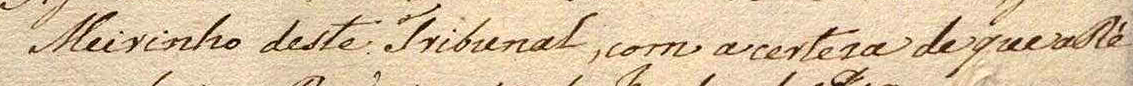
Meirinho deste Tribunal, com a certeza de que a Ré
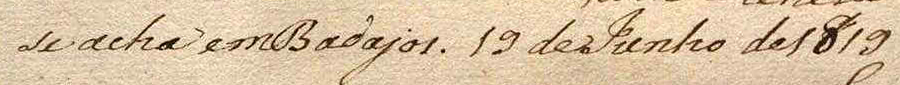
se acha em Badajos. 19 de Iunho de 1819
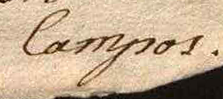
Campos.
